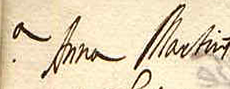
.a Anna Martin̄s.
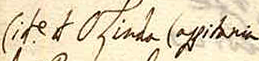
Cid̄.e d̄ OLinda Cappitania
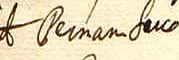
d̄ Pernambuco.
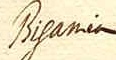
Bigamia
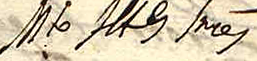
M.to Iltes Snr̄es
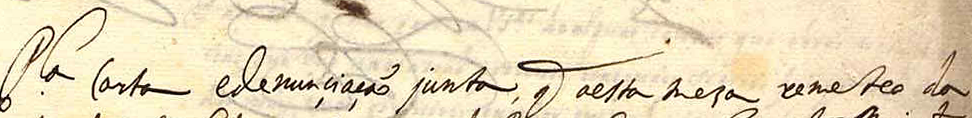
P.la Carta e denunciaçaõ junta, q̄ a esta meza remeteo da
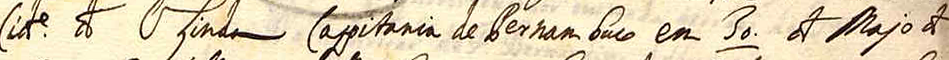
Cid̄e. d̄ OLinda Cappitania de Pernambuco em 30. d̄ Majo d̄
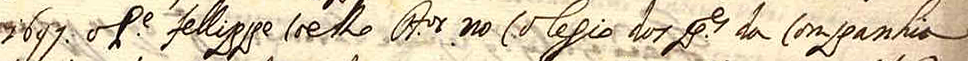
1699. o P.e fellippe coelho R.or no Colegio dos P.es da Companhia
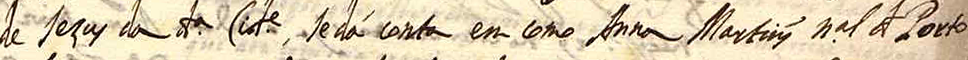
de Iezus da d̄.a Cid̄e., se dá conta em como Anna Martin̄s n.al d̄ Porto
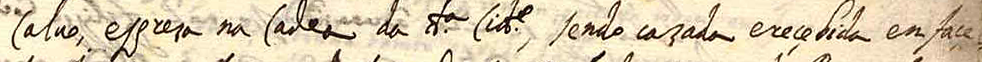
Caluo, e preza na Cadea da d̄.a Cid̄.e, sendo cazada e reçebida em face
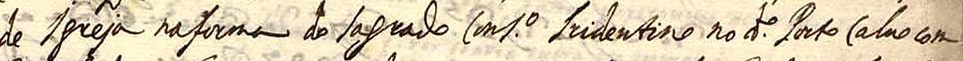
de Igreja na forma do sagrado Cons.o tridentino no d̄.o Porto Caluo com
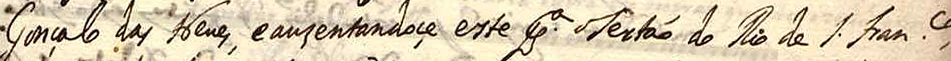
Gonçalo das Neues, e auzentandoçe este p.a o Sertão do Rio de S. Fran.co
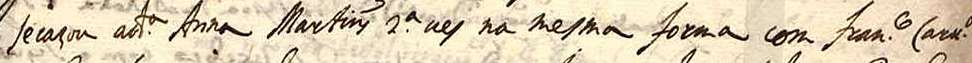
se cazou a d̄.a Anna Martin̄s 2.a ves na mesma forma com Fran.co Caru.o
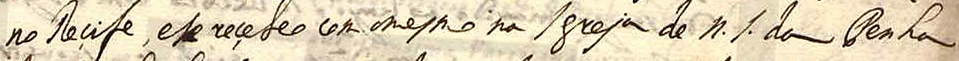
no Recife, e se reçebeo com o mesmo na Igreja de n. s. da Penha
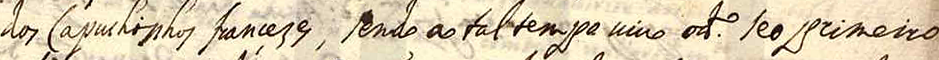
dos Capuchinhos françezes, sendo ao tal tempo uiuo o d̄.o seo primeiro
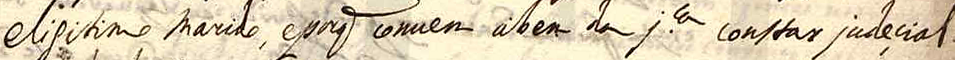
e ligitimo marido, e porq̄ conuem a bem da j.ca constar judeçial
